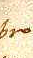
7bro
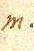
4 m.
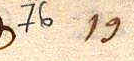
19
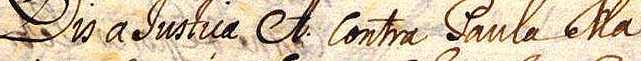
Dis a Iustiça A. contra Paula Ma
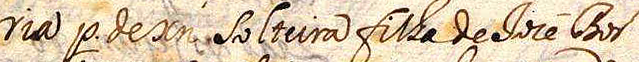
ria p. de xn solteira filha de Iozé Bor
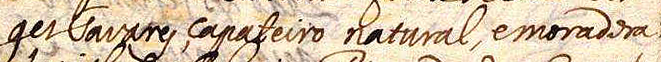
ges Tavares çapateiro natural, e moradora
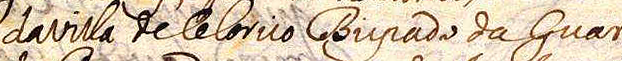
da villa de Celorico Bispado da Guar
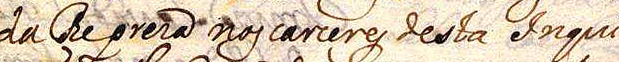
da Re preza nos carceres desta Inqui
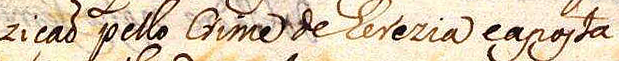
ziçaõ pello Crime de herezia e aposta
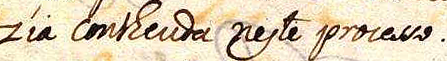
zia contheuda neste processo.
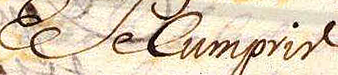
E Se cumprir
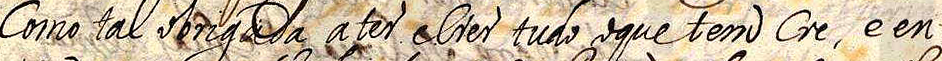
Como tal obrigada a ter e Crer tudo o que tem Cre, e en
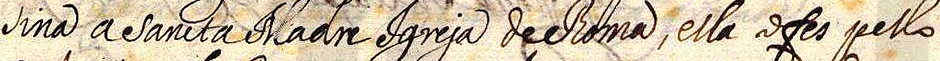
sina a sancta Madre Igreja de Roma, ella o fes pello
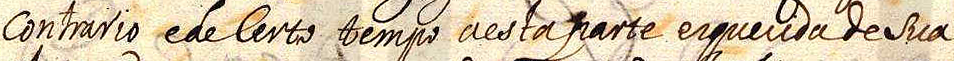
contrario e de Certo tempo a esta parte esquecida de sua
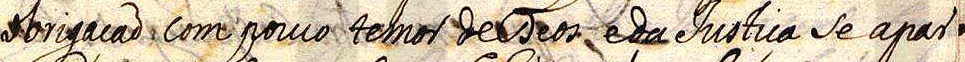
obrigação, com pouco temor de Deos e da Iustiça se apar
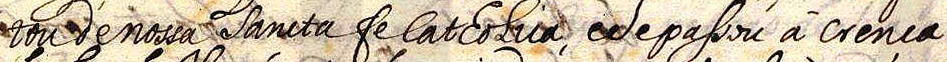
tou de nossa Sancta fe CathoLica, e se passou á crença
